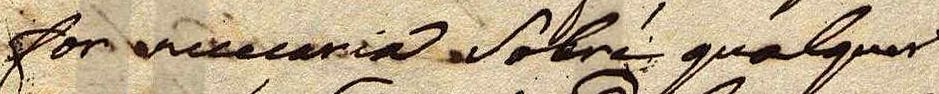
for neceçaria Sobre qualquer
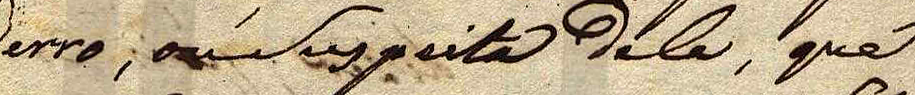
erro, ou Suspeita dela, que
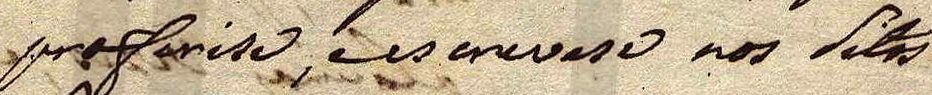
proferise, e escrevese nos ditos
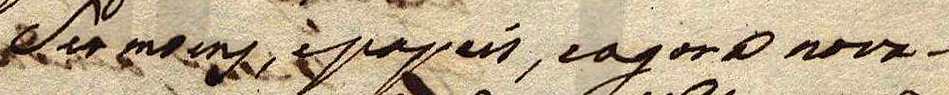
sermoens, e papeis, e agora nova
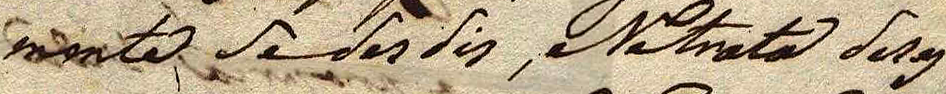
mente se desdis, e Retrata deses
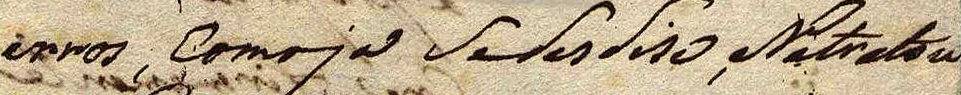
erros, Como ja Se desdise, e Retratou
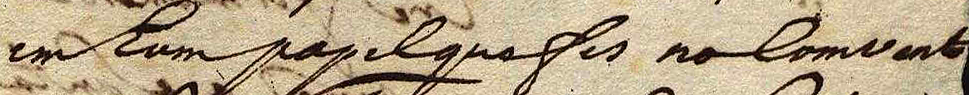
em hum papel que fes no Comvento
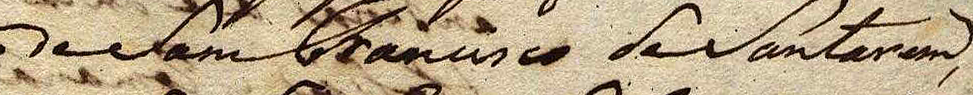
de Sam Francisco de Santarem,
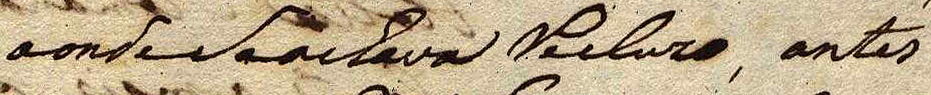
aonde Se achava Recluzo, antes
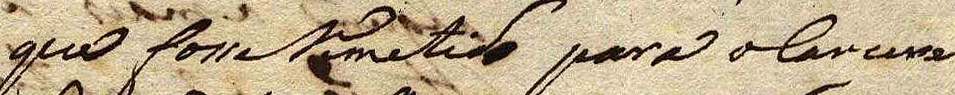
que fosse Remetido para o Carcere
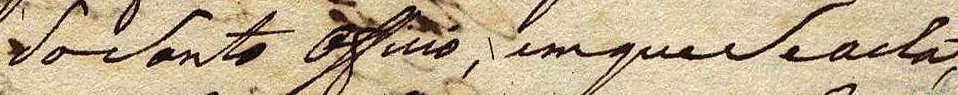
do Santo Officio, em que Se acha,
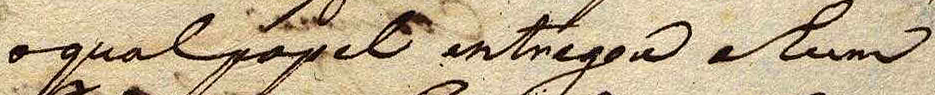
o qual papel entregou a hum
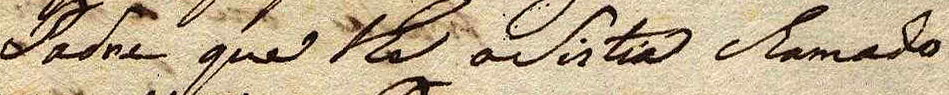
Padre que lhe aSistia chamado
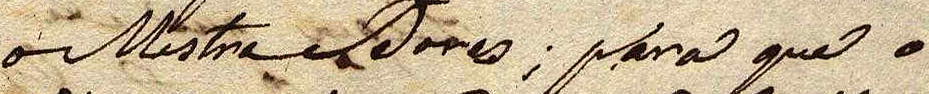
o Mestra Dores; para que o
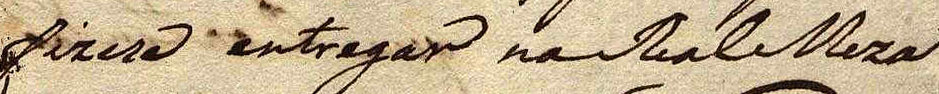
fizese entregar na Real Meza
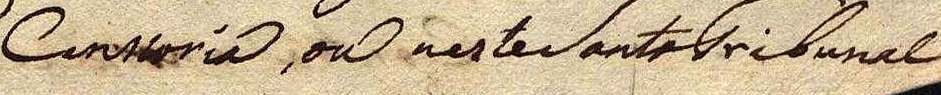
Censsoria, ou neste Santo Tribunal
